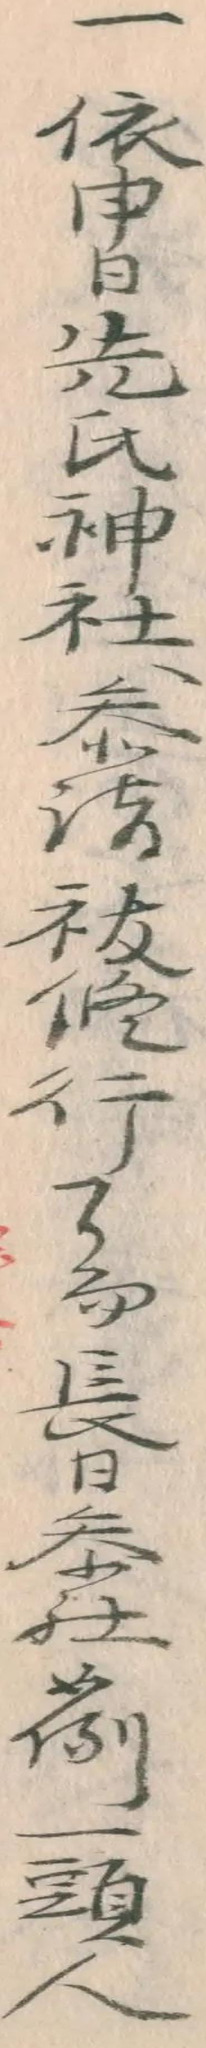一依申日先氏神社へ参詣祓修行了而長日参社如例一頭人
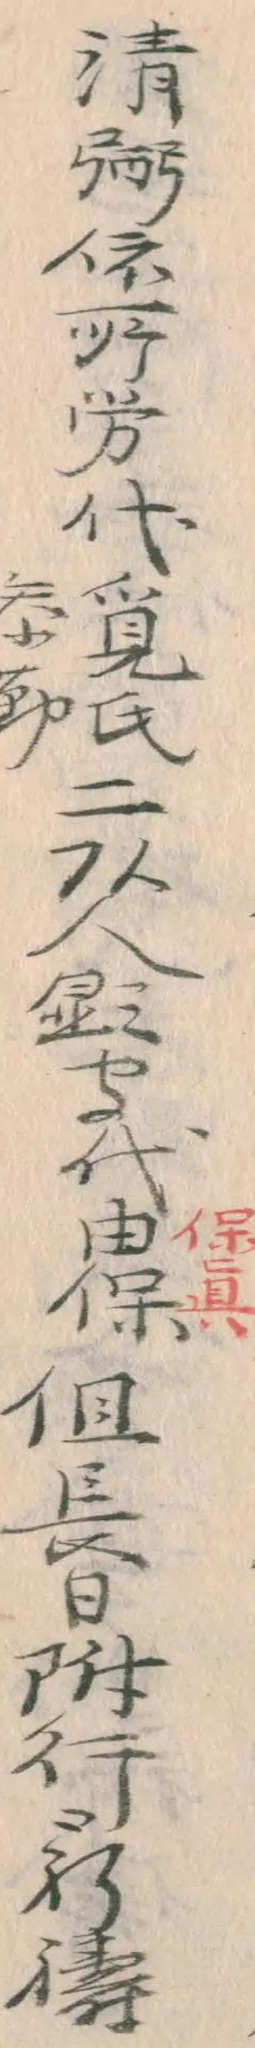清弼依所労代覓氏参勤二頭人顕守代由保但長日附行御祈祷
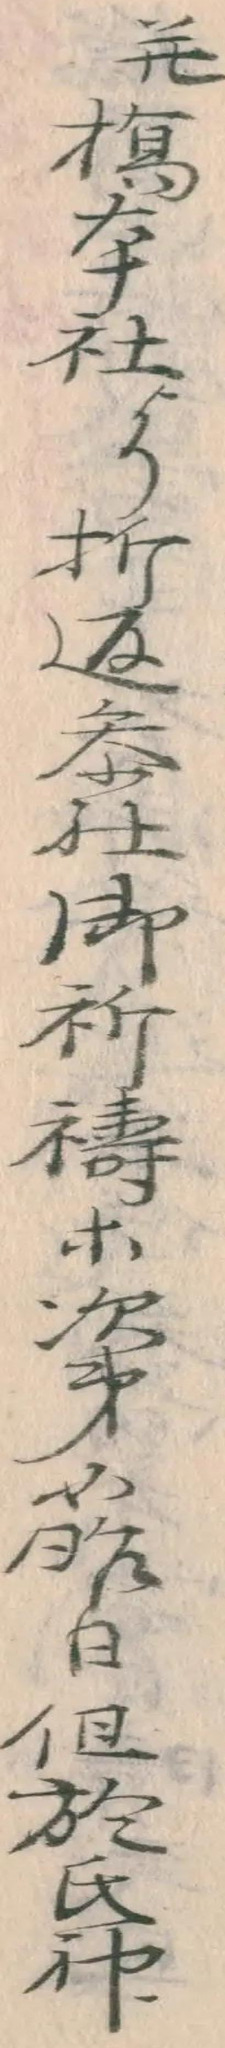并橋本社より折返参社御祈祷等次第如昨日但於氏神
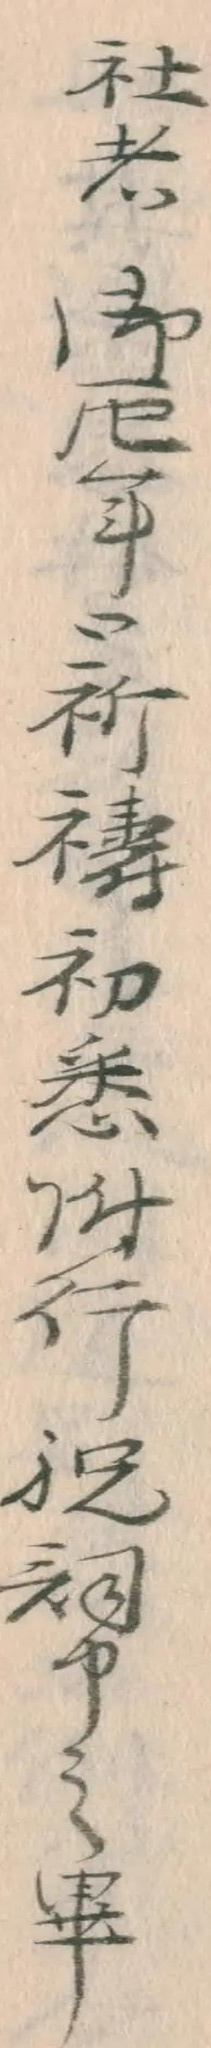社者御厄年御祈祷初悉附行祝詞申之畢
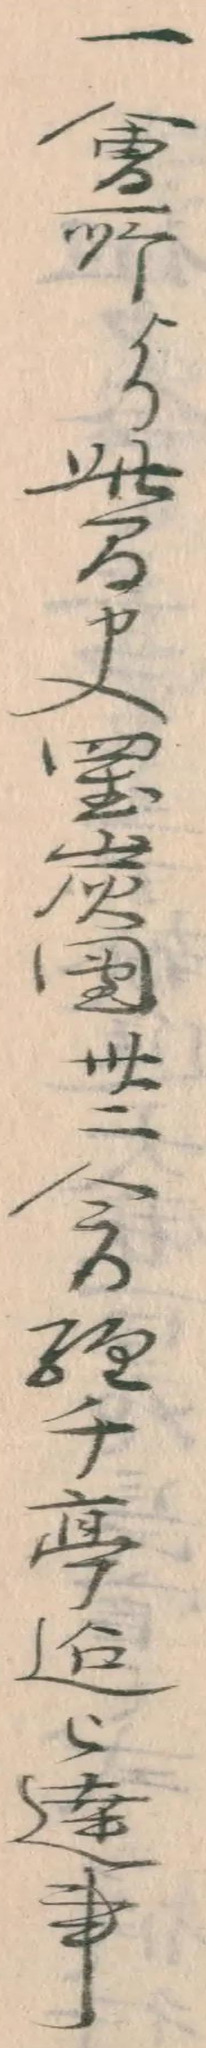一會所より此間申入置炭団卅二今日経千亭迄被達事
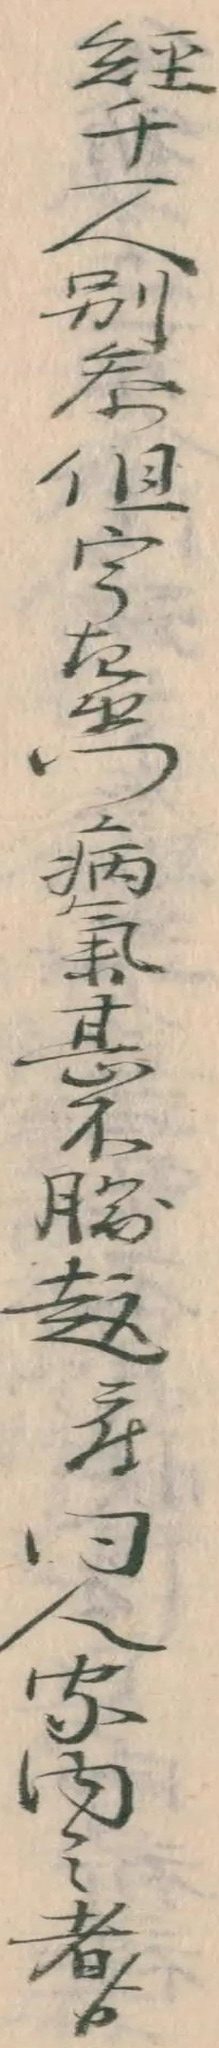経千一人別参但宇左衛門病氣甚不勝趣ニ付同人家内之者ゟ
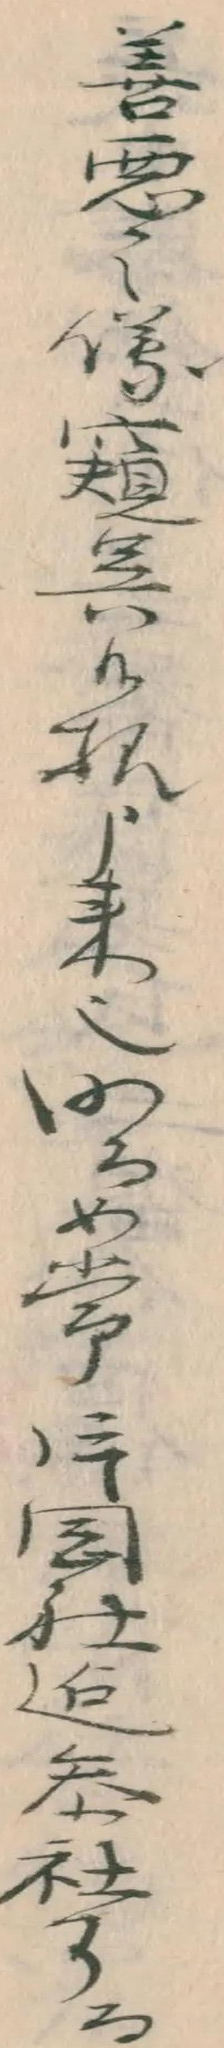善悪之儀窺呉候様申来也仍而如常片岡社迄参社了而
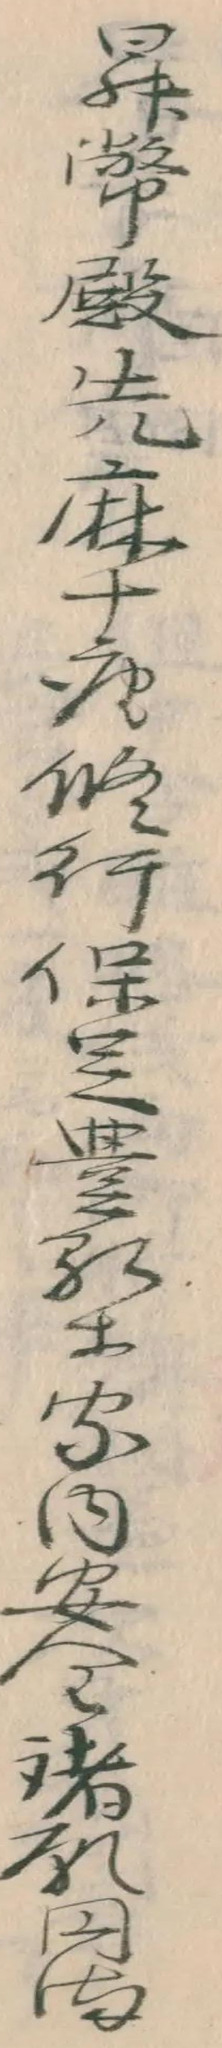昇幣殿先麻十座修行保足豊顕等家内安全諸願円満
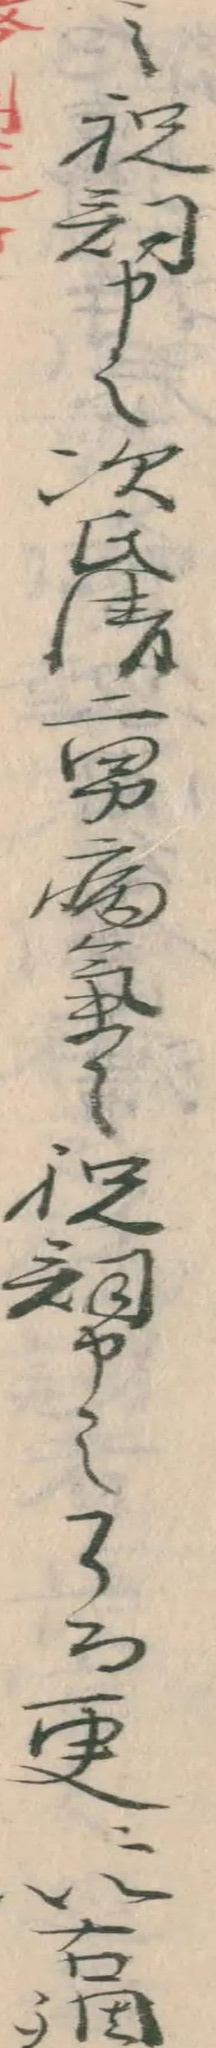之祝詞申之次氏清二男病氣之祝詞申之了而更ニ以古調
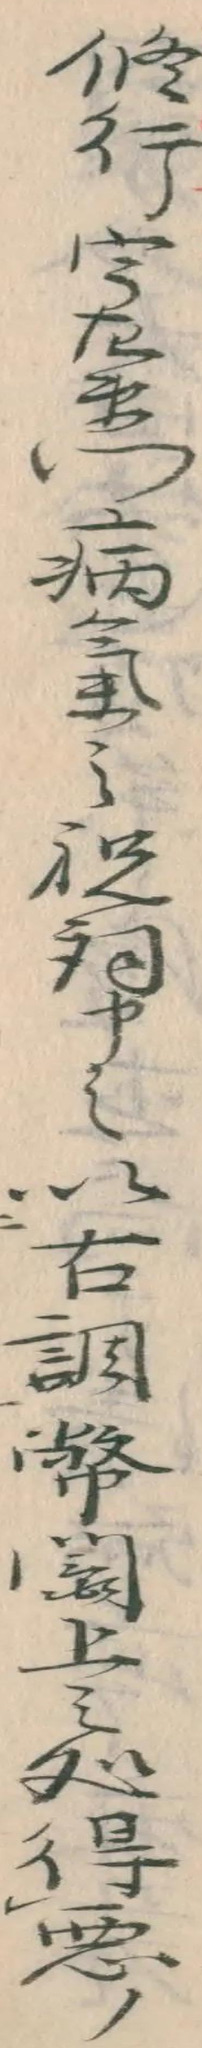修行宇左衛門病氣之祝詞申之以古調幣鬮上之処得悪ノ
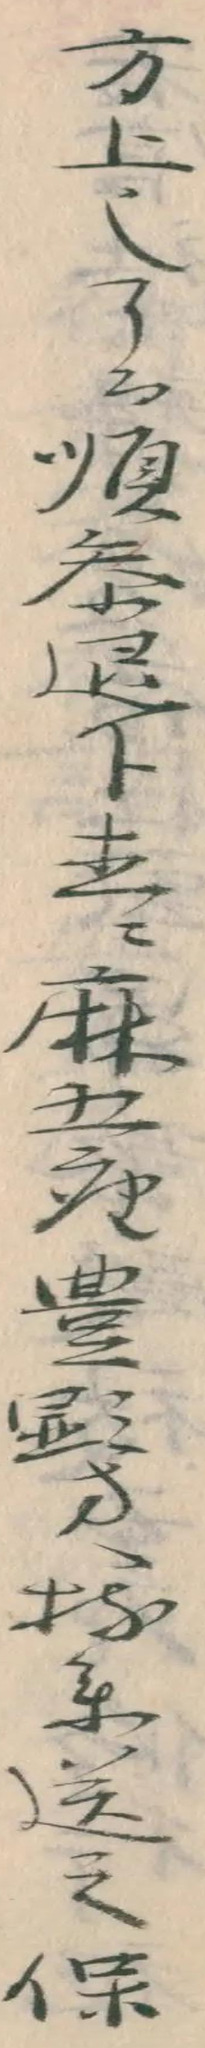方上也了而順参退下直ニ麻五座豊顕方へ持参送之保
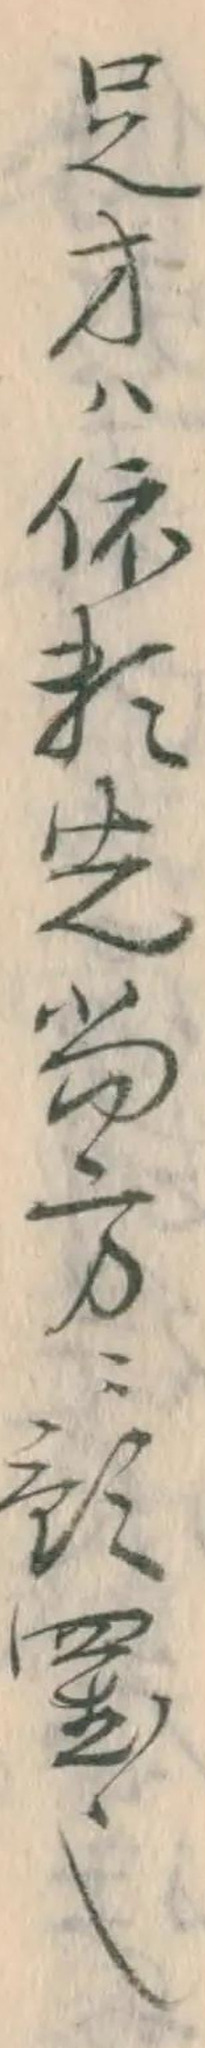足方ハ依頼先當方に預置也
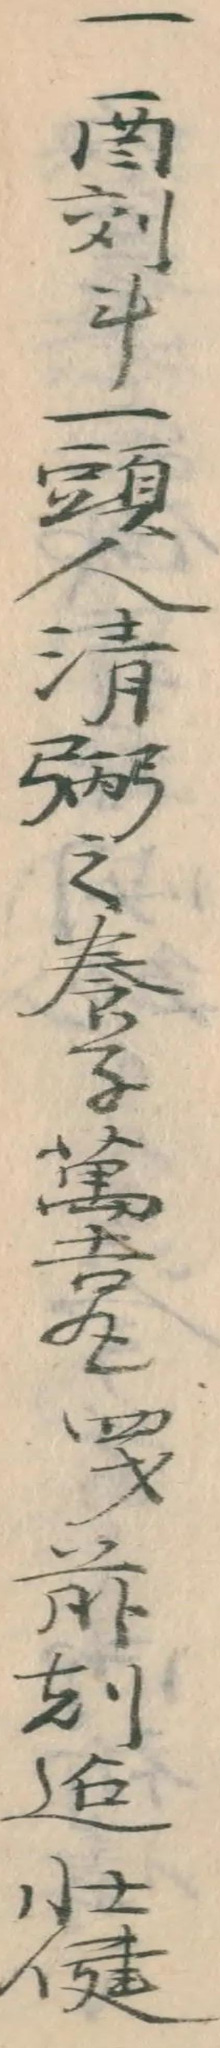一酉刻斗一頭人清弼之養子萬吉丸四才前刻迄壮健

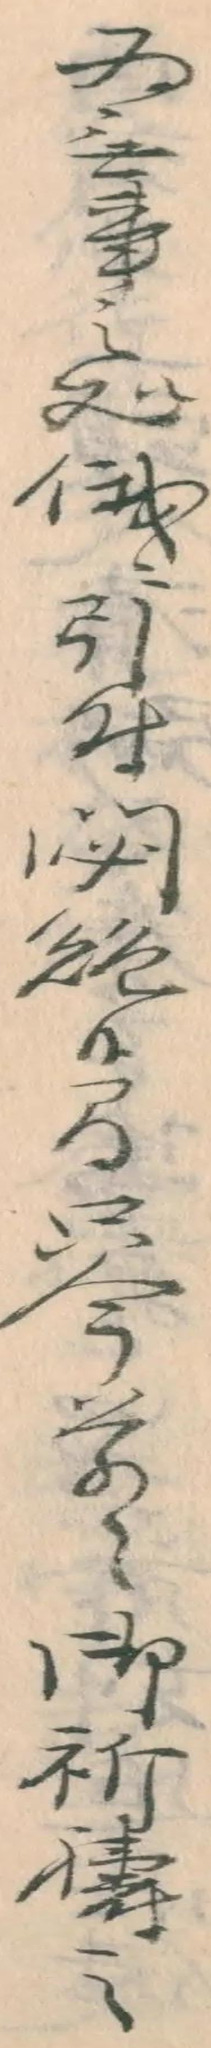為無事之処俄ニ引付悶絶候間只今前之御祈祷之
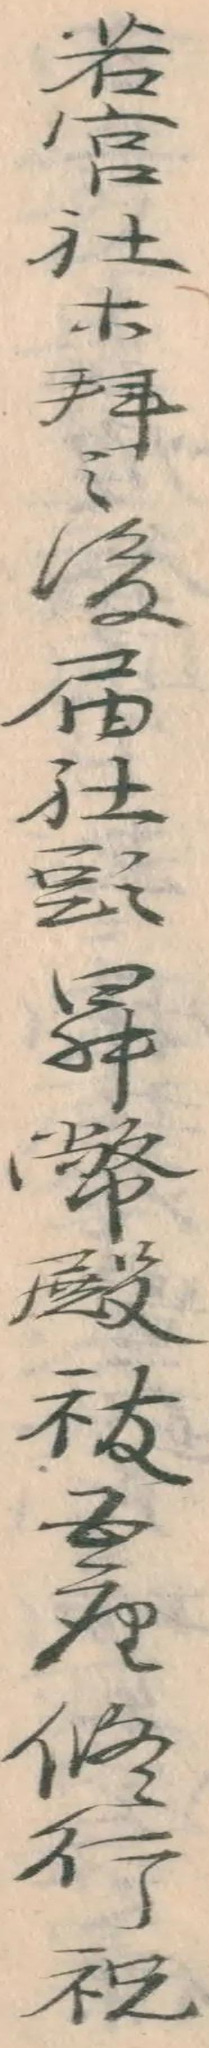若宮社等拝之後届社頭昇幣殿祓五座修行祝
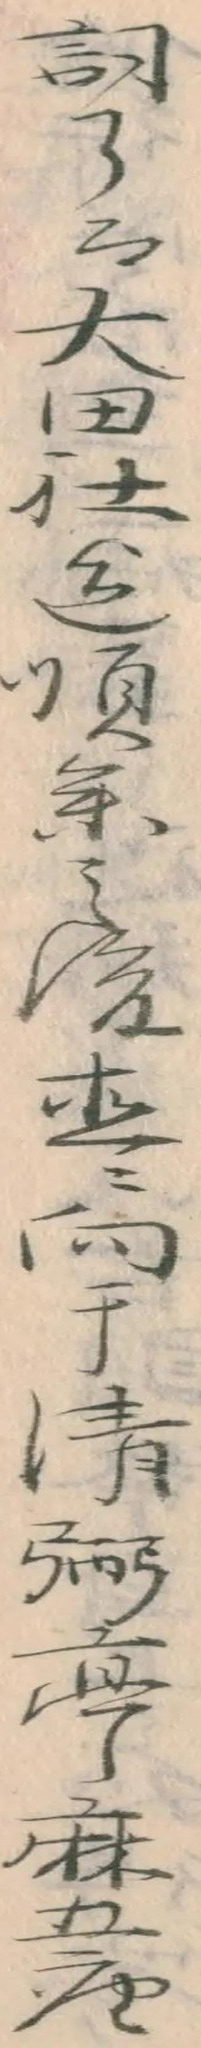詞了而大田社迄順参之後直ニ向于清弼亭麻五座
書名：賀茂社記録. 第73冊
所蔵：国立国会図書館 National Diet Library, JAPAN
